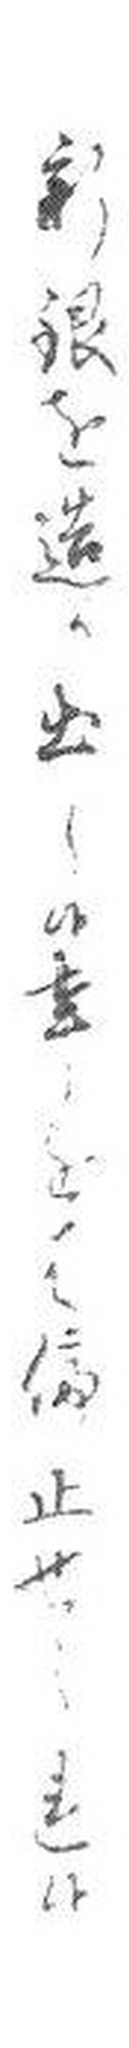新銀を造り出し候事をは停止せられ候
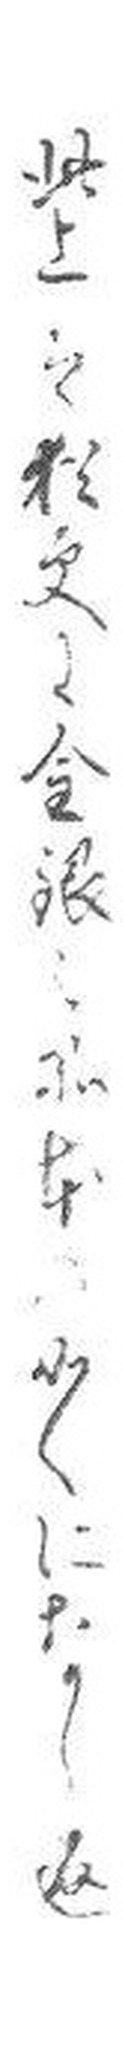此上は猶更に金銀之品本の如くになし返
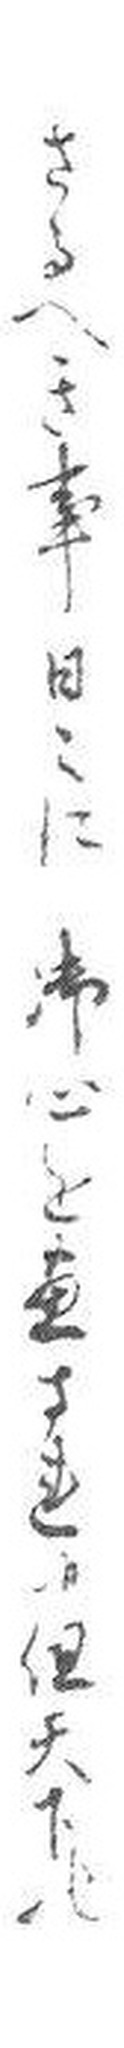さるへき事日々に御心を尽され候但天下の
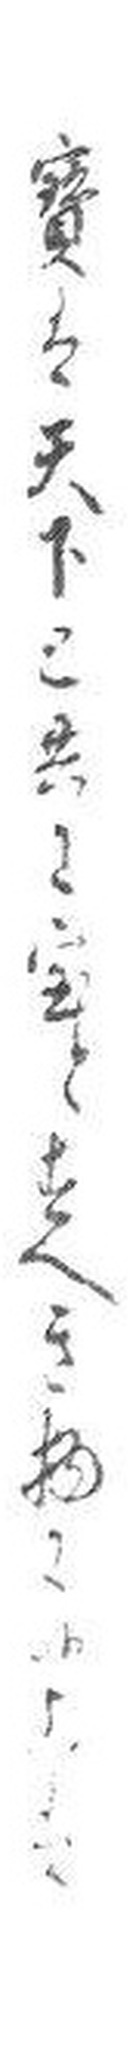宝は天下と共に宝とすへき物に候上は
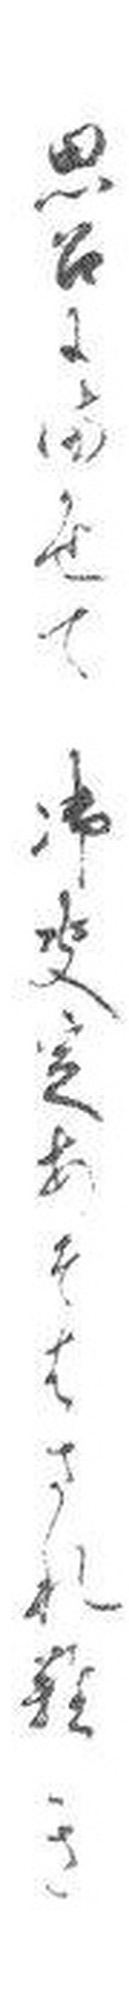思召にまかせて御決定あそはされ難き
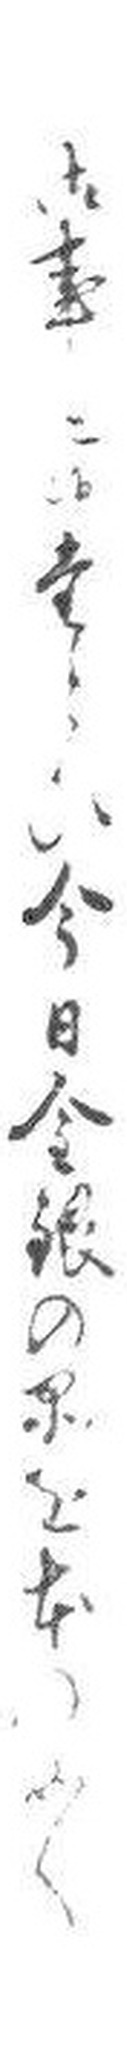御事ニ候たとひ今日金銀の品を本の如く
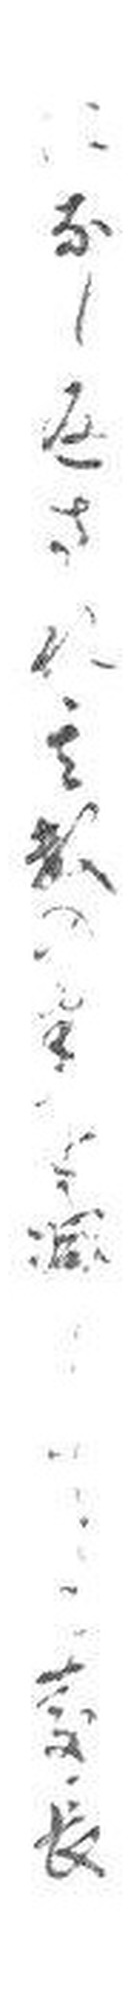になし返され其数の半を減し候とも慶長
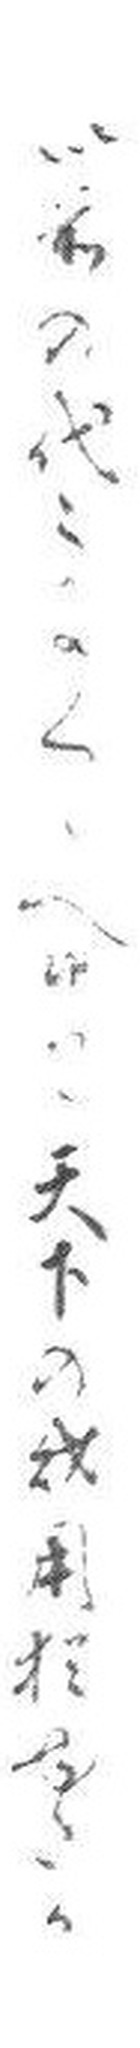以前の代々にくらへ候ハヽ天下の財用猶ゆたか
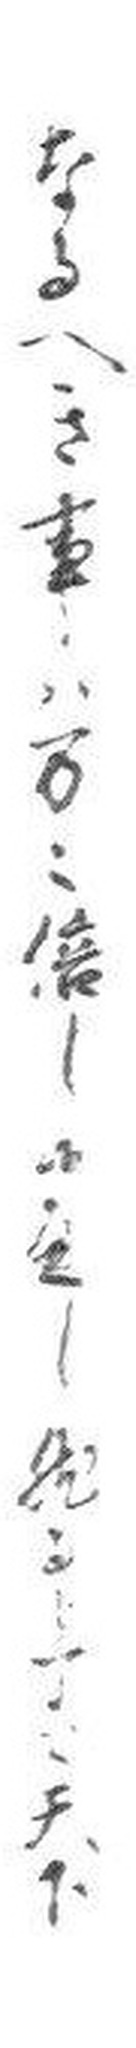なるへき事ハ万々倍し候へし然る上は天下
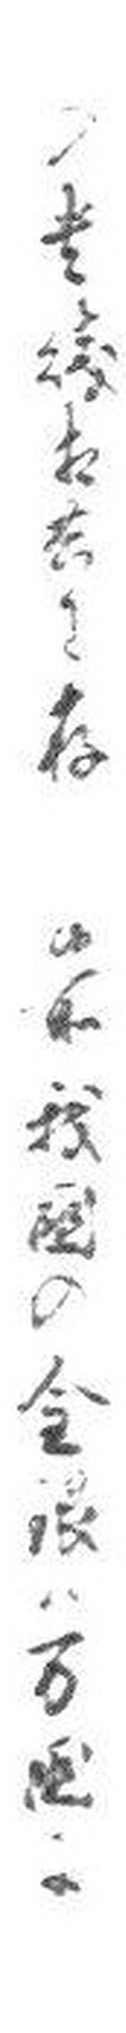の貴賤相共に存候所我国の金銀ハ万国に
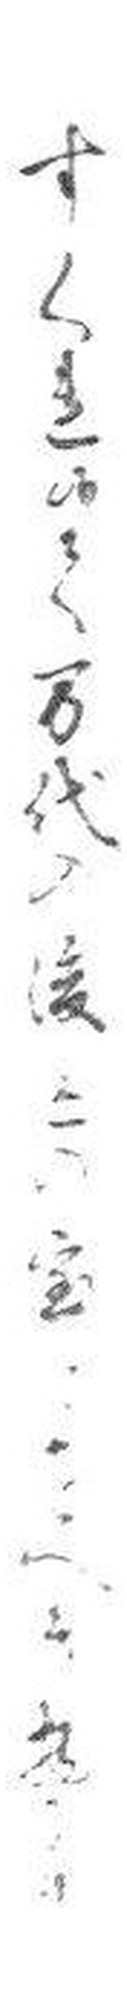すくれ候て万代の後迄の宝にすへきは物に候
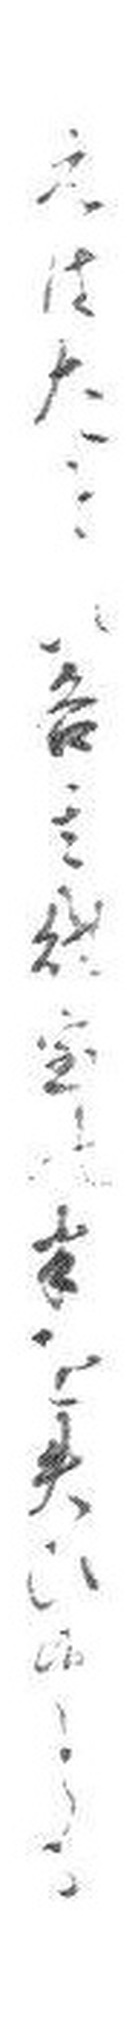えはたとひ各其財宝の半を失ひ候とも
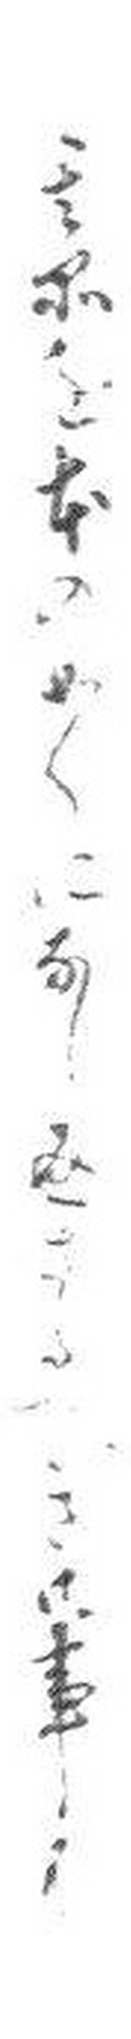其品を本の如くになし返さるへき御事と
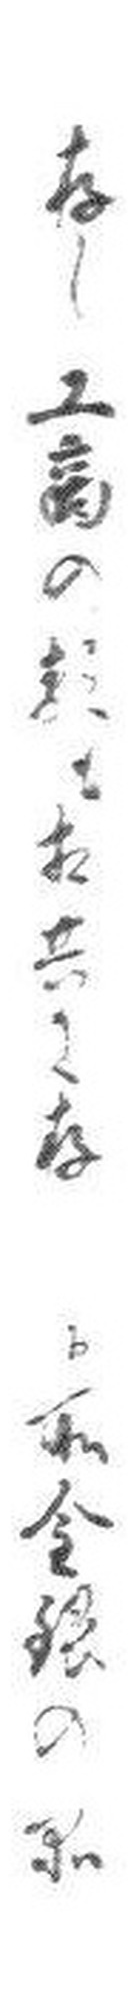存し工商の類も相共に存し候所金銀の品
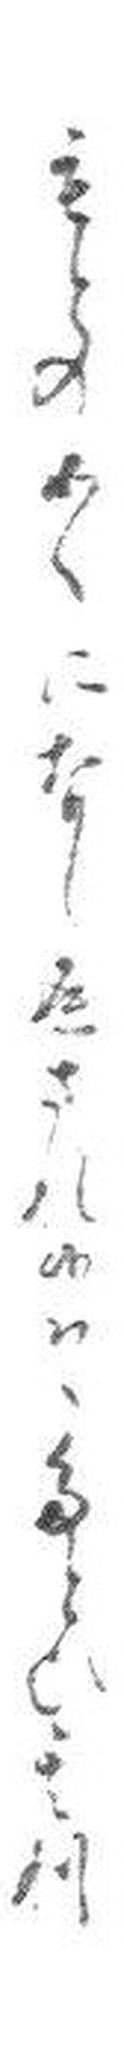もとの如くになし返され候ハヽたとひ其利
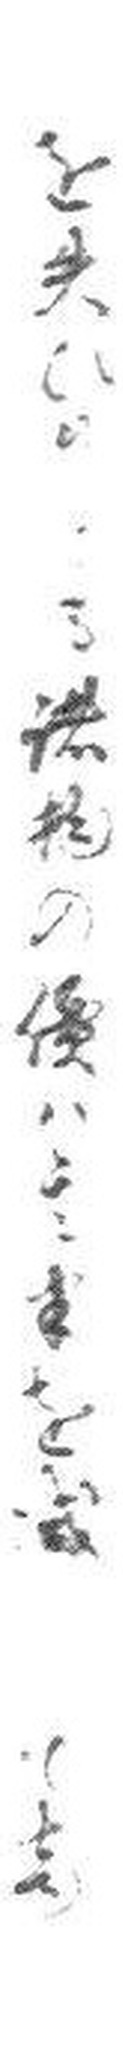を失ひ候る諸物の価ハ其半を減しても商
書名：家譜 二十九 吉邦公 従正徳二年到正徳三年
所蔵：福井県文書館 Fukui Prefectural Archives
